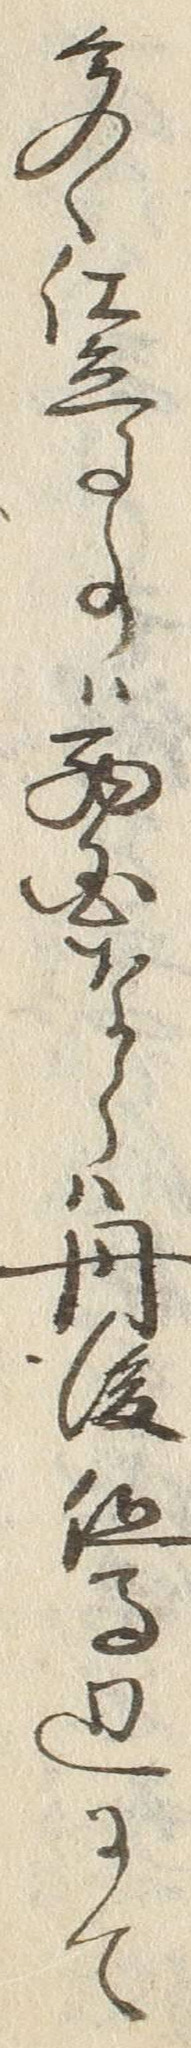多く仕立る事は西國ならは丹後但馬辺尓て
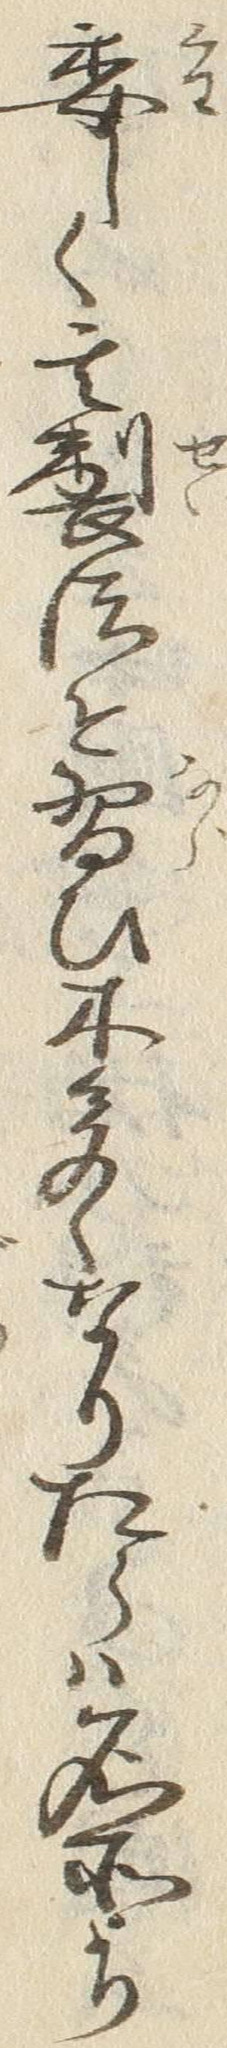委しく其製法を習ひ木多くなりたらは名所より
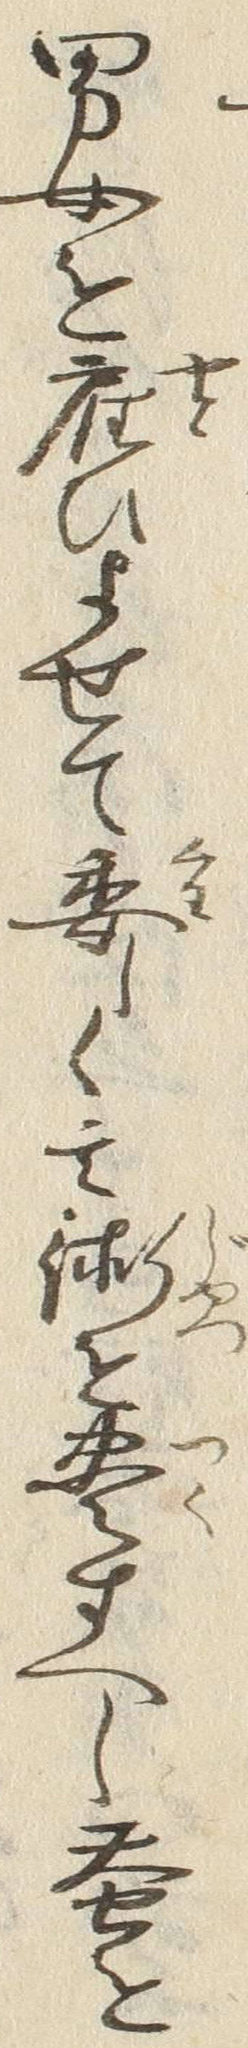男女を雇ひよせて委しく其術を盡すへし蚕を
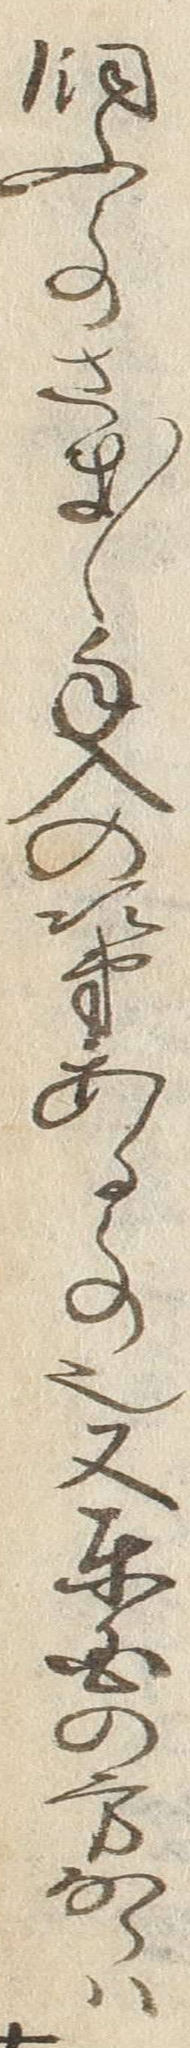飼ふ事さま〴〵手入の次第ある事也又東国の方ならは

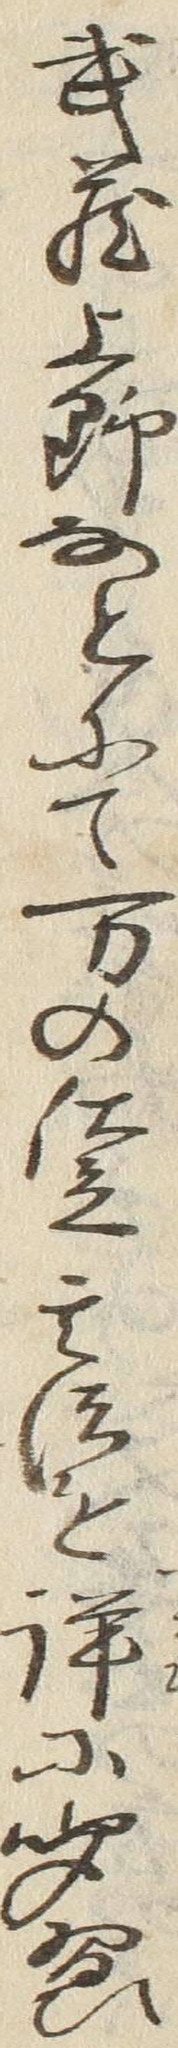武蔵上野なと尓て万の仕立其法を詳尓聞習ひ
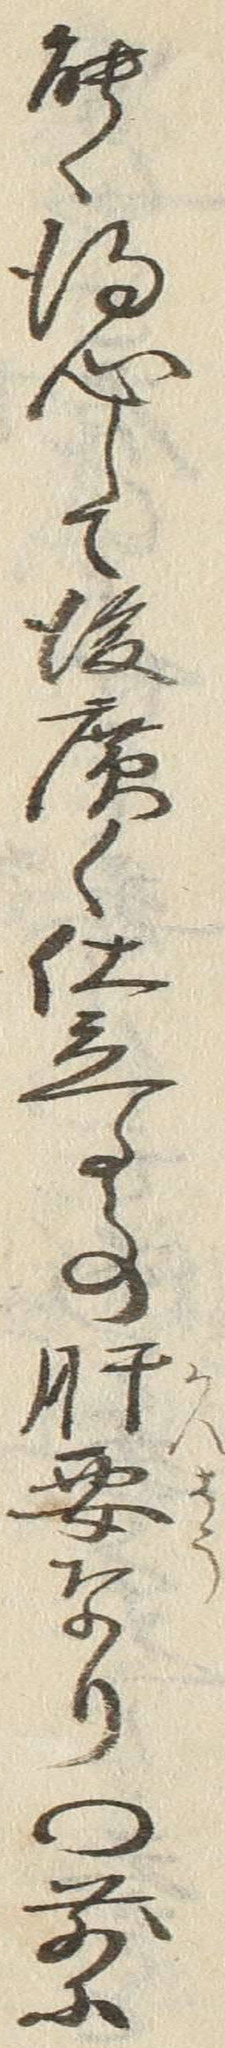能く得心して後廣く仕立る事の肝要なり〇前尓
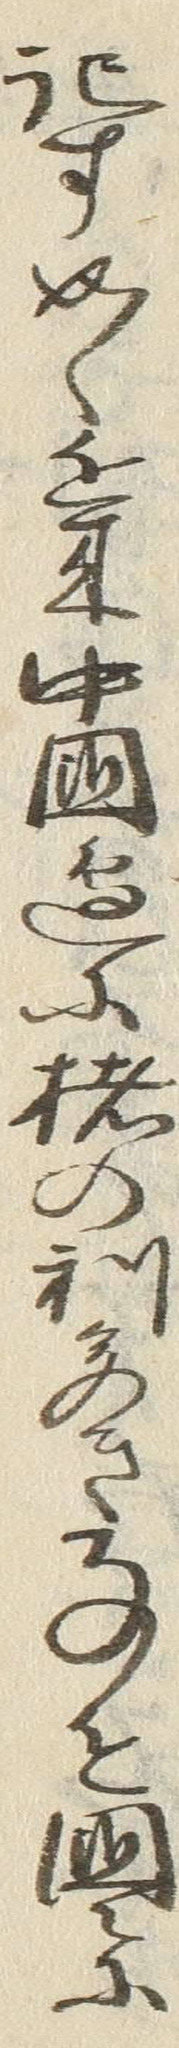記す如く近来中國邊尓楮の利多き事を國々尓
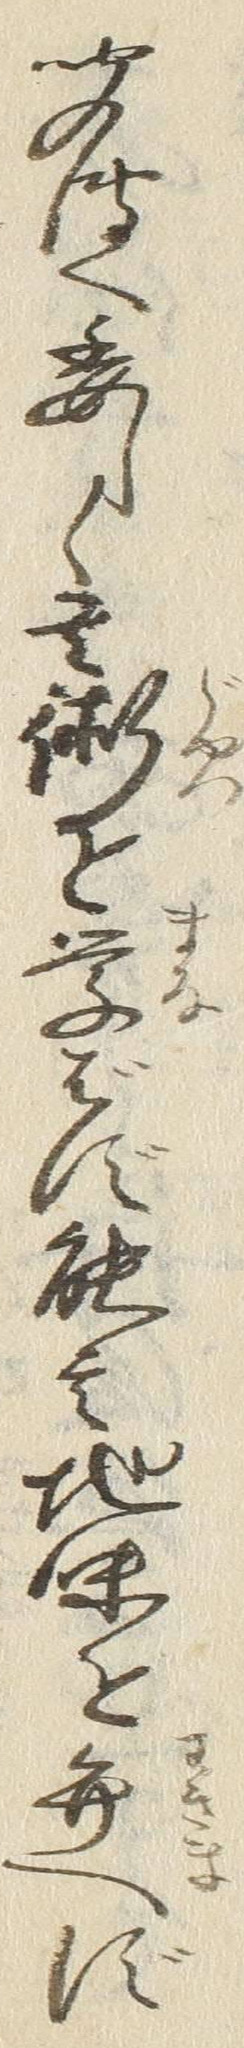聞傳へ委しく其術を学ばず能其地味を弁へず
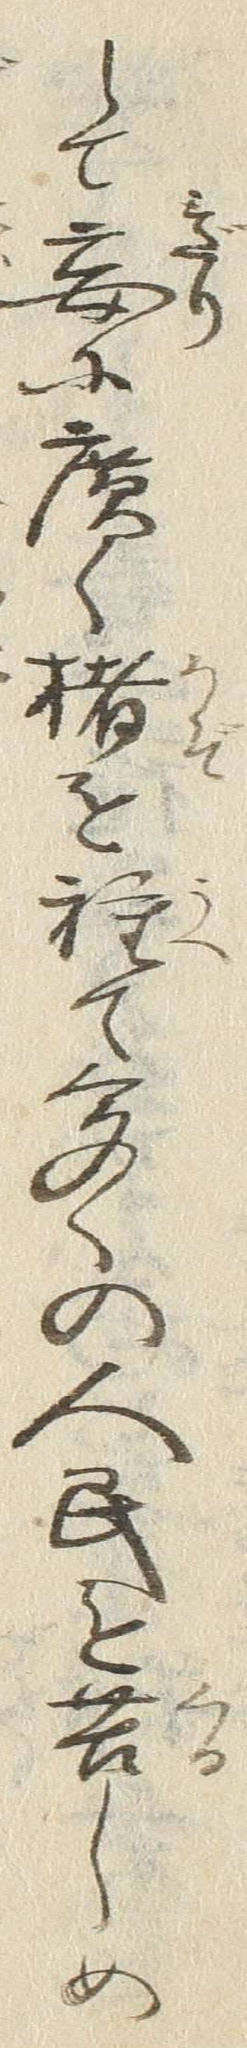して妄尓廣く楮を種て多くの人民を苦しめ
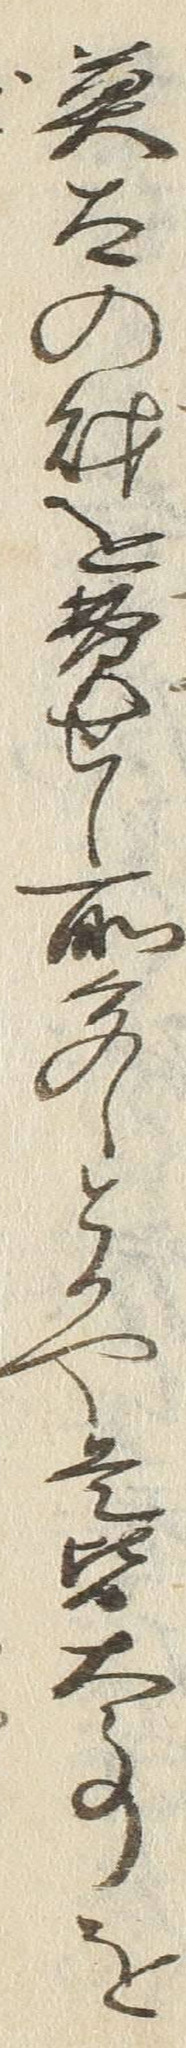莫太の財を費せし所多しとかや是皆大事を
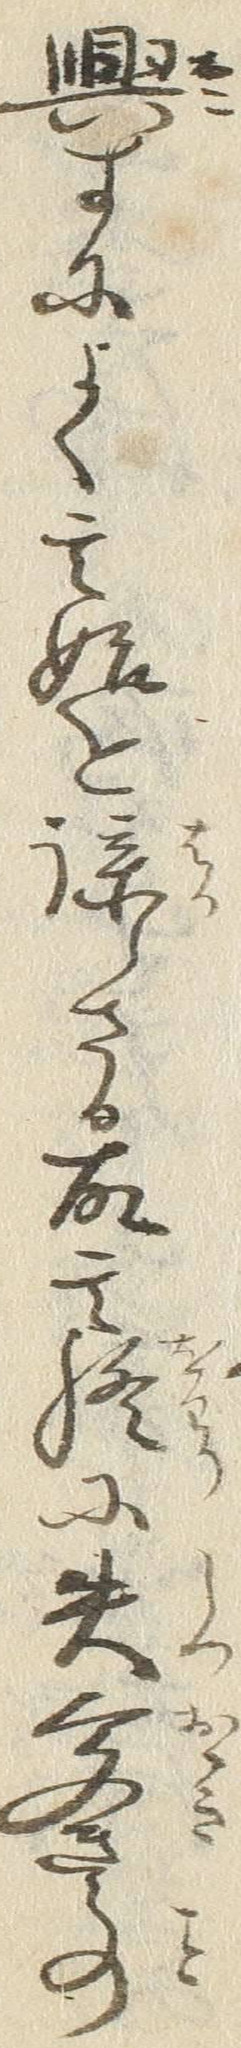興す尓よく其始を謀らさる故其終尓失多き事
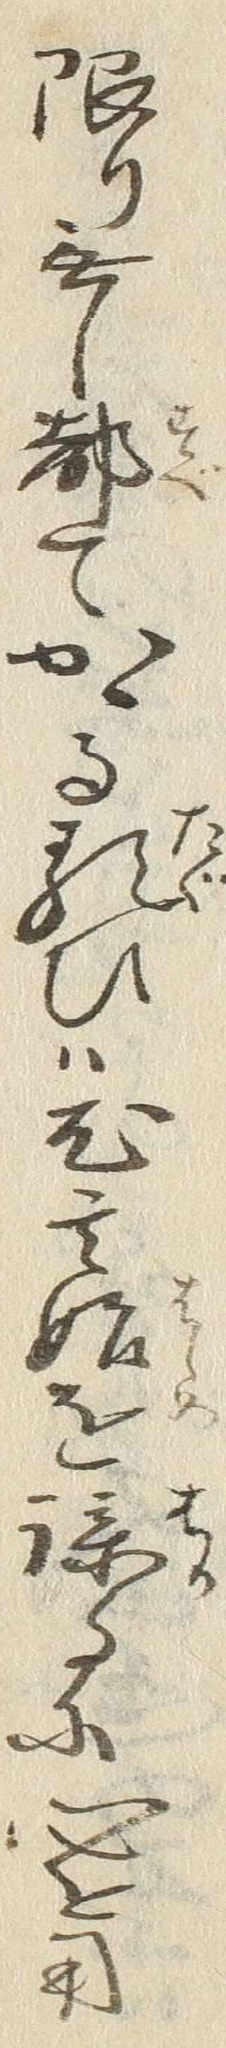限り無し都てかゝる類ひは尤其始を謀る尓心を用
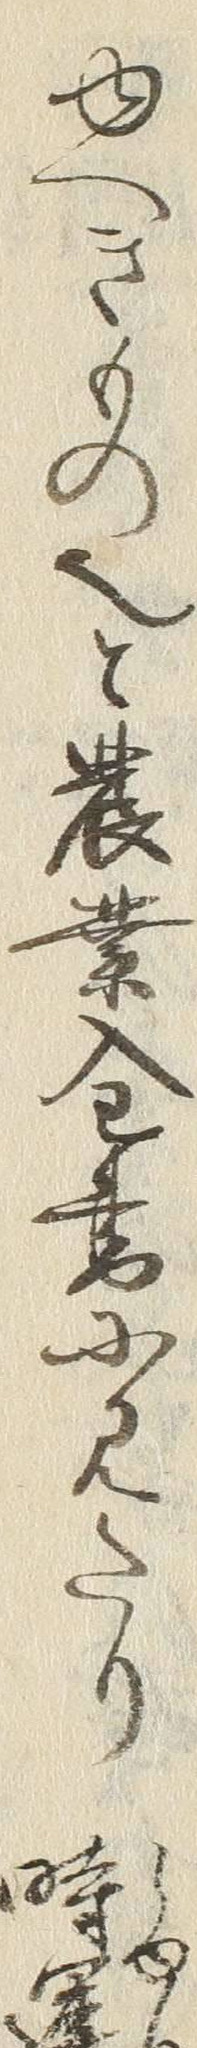ゆへきもの也と農業全書尓見たり時運
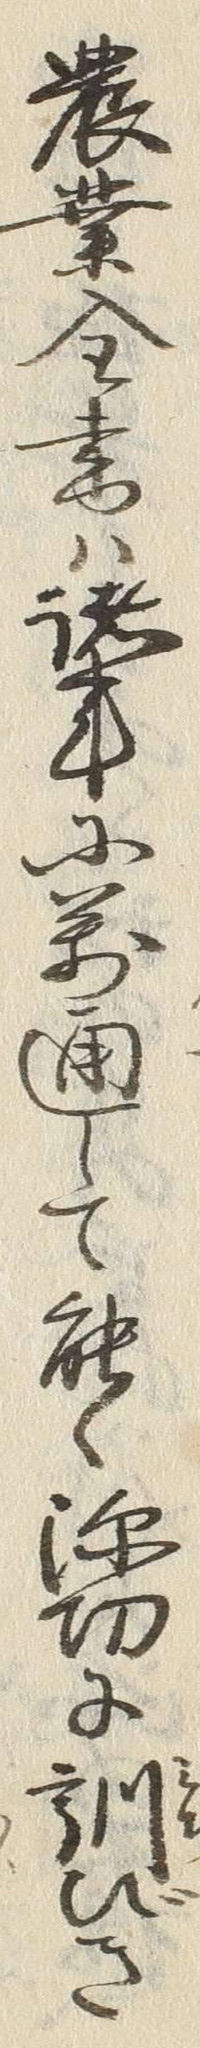農業全書は諸事尓萬通して能く深切尓訓びき
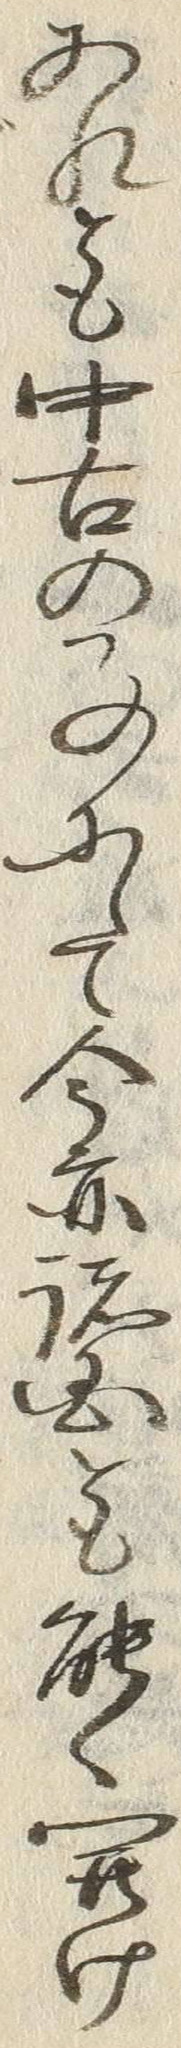あれとも中古の事尓して今亦諸国とも能く開け
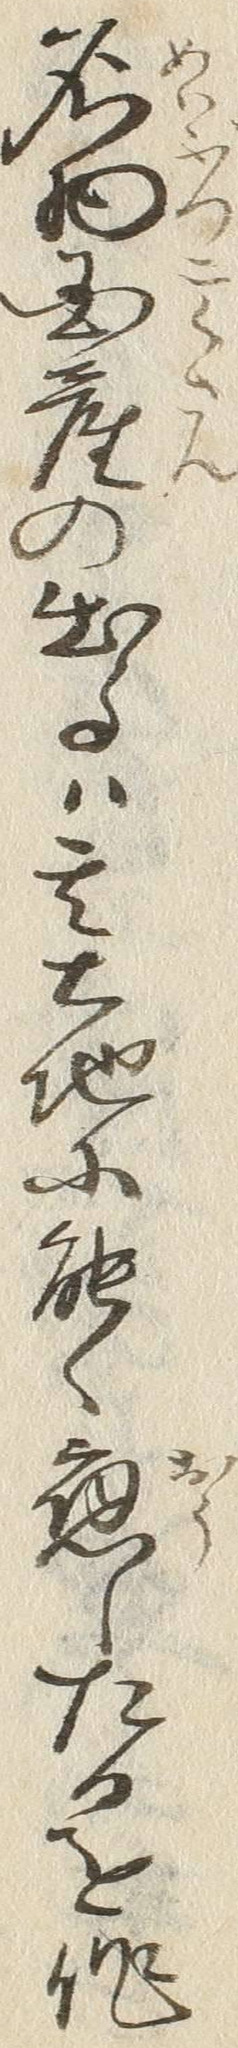名物國産の出るは其土地尓能く應したるを作
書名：養蠶實驗録後編
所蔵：東京大学農学生命科学図書館 国文学研究資料館
